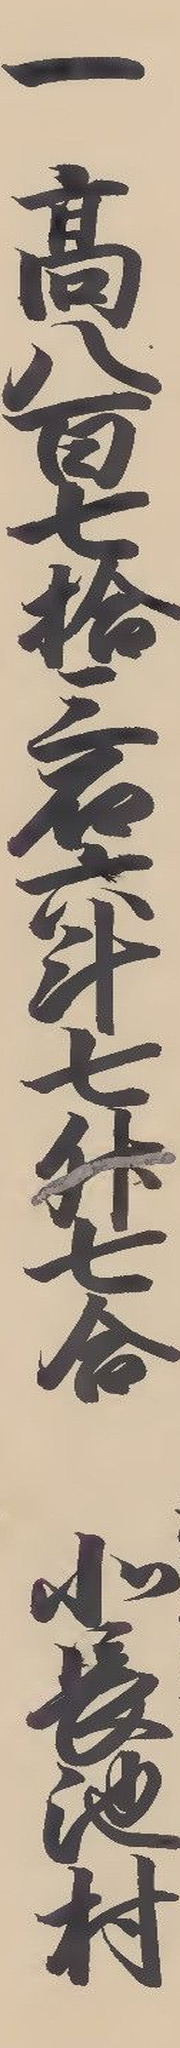一高八百七拾三石六斗七升七合北長池村

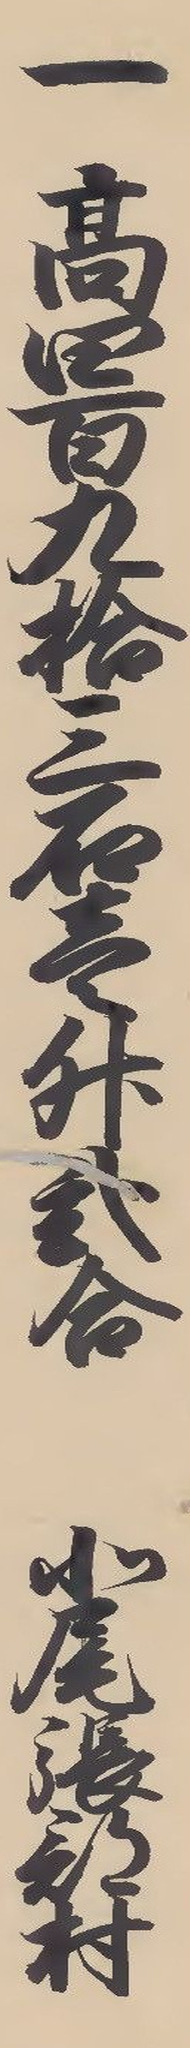一高四百九拾三石壱升弐合北尾張部村
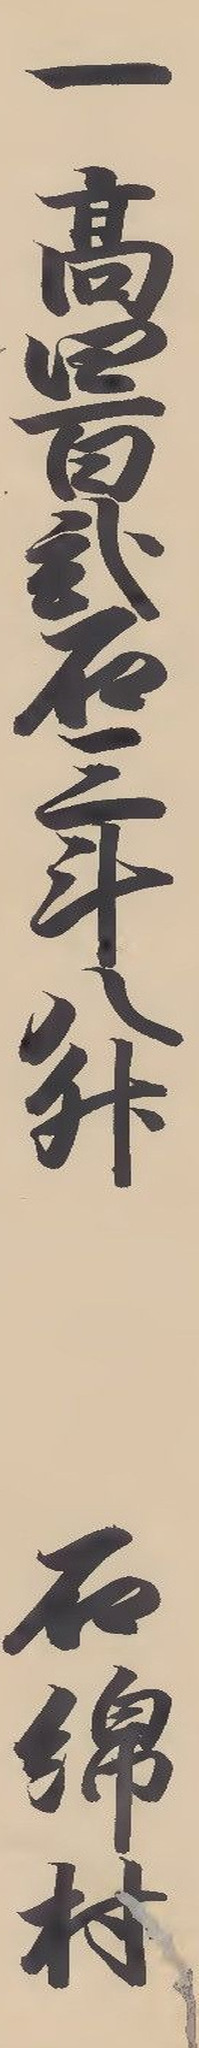一高四百弐石三斗八升石綿村
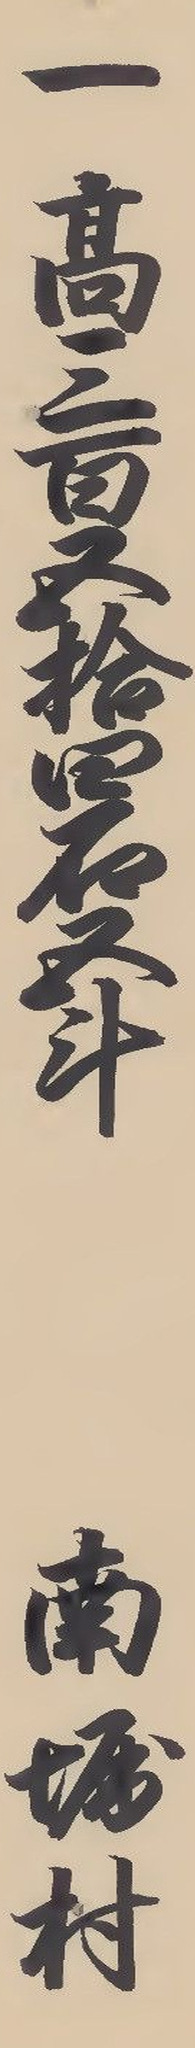一高三百五拾四石五斗南堀村
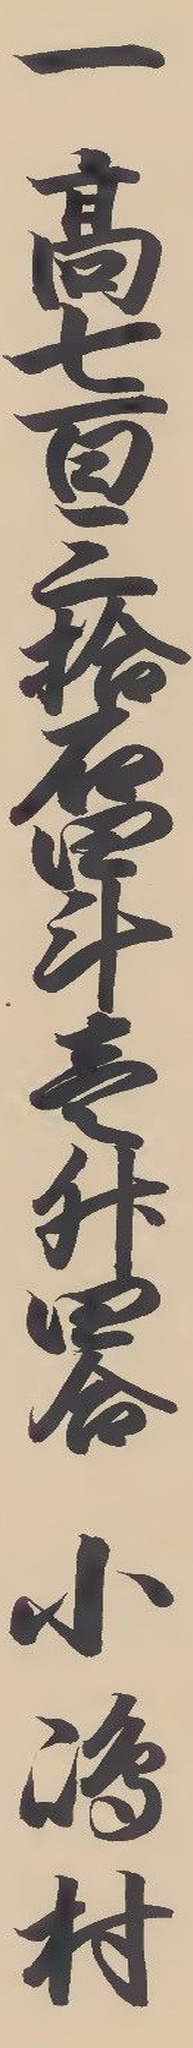一高七百三拾石四斗壱升四合小嶋村
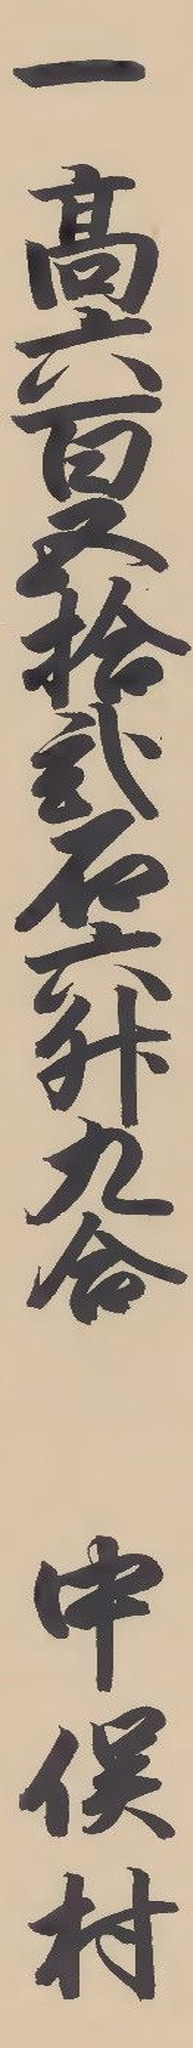一高六百五拾弐石六升九合中俣村
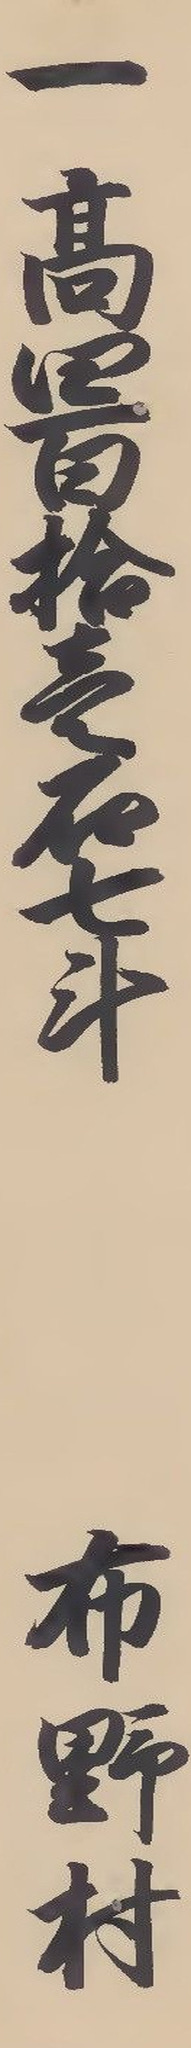一高四百拾壱石七斗布野村
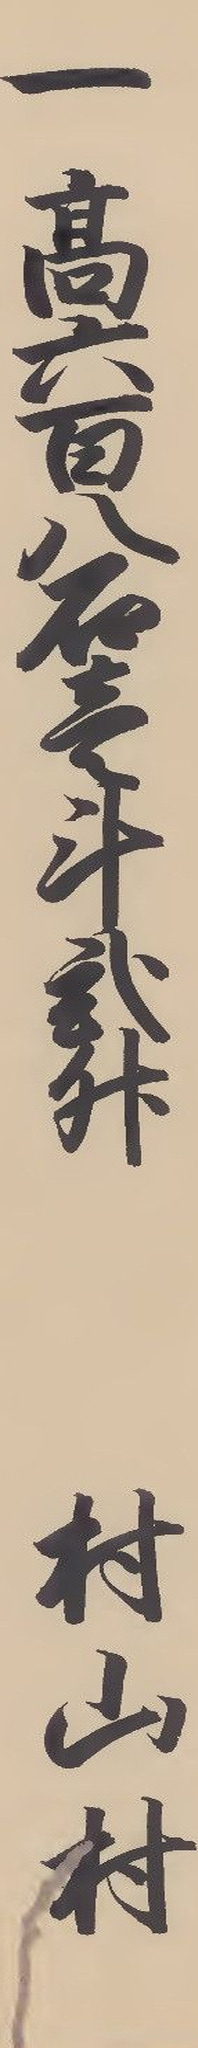一高六百八石壱斗弐升村山村
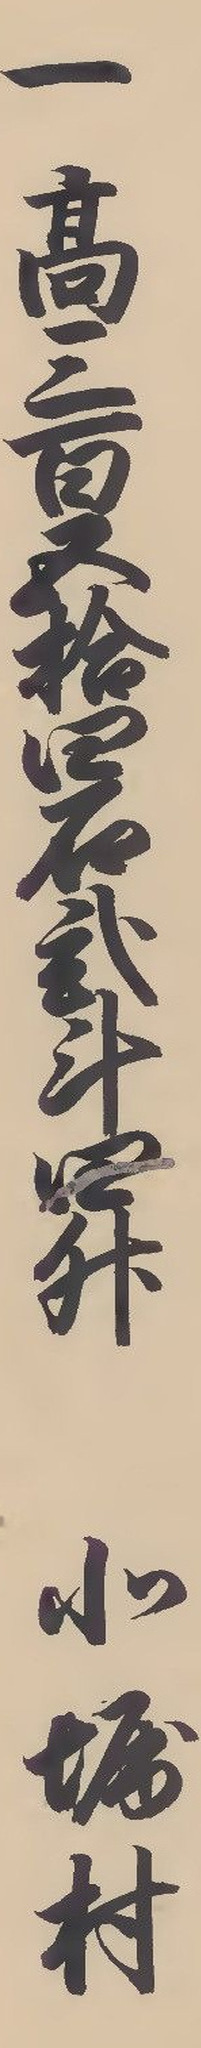一高三百五拾四石弐斗四升北堀村

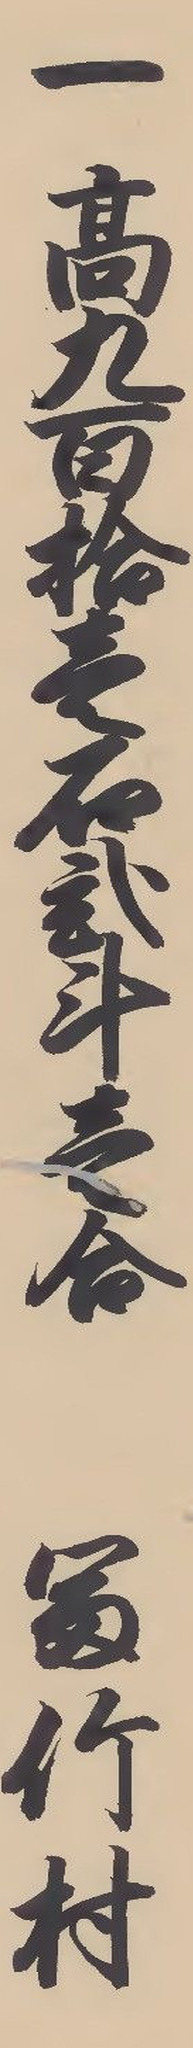一高九百拾壱石弐斗壱合富竹村
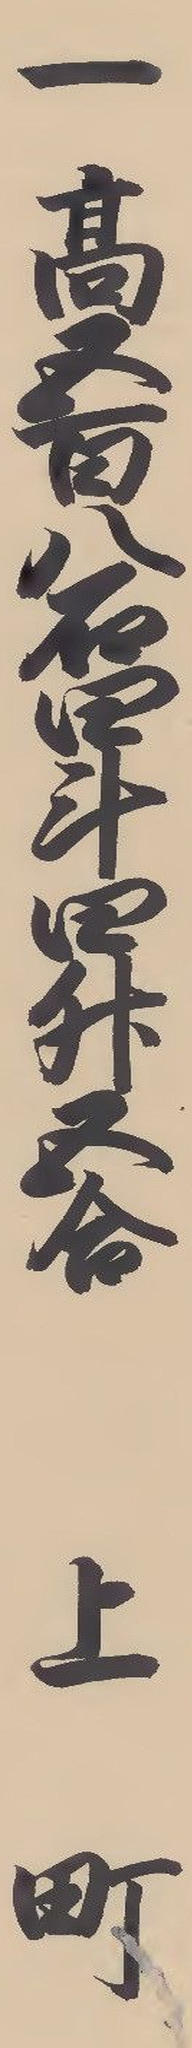一高五百八石四斗四升五合上町
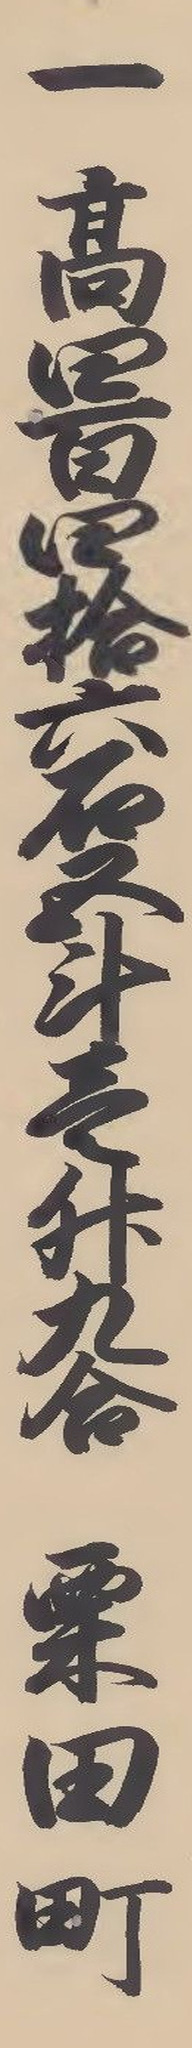一高四百四拾六石五斗壱升九合栗田町
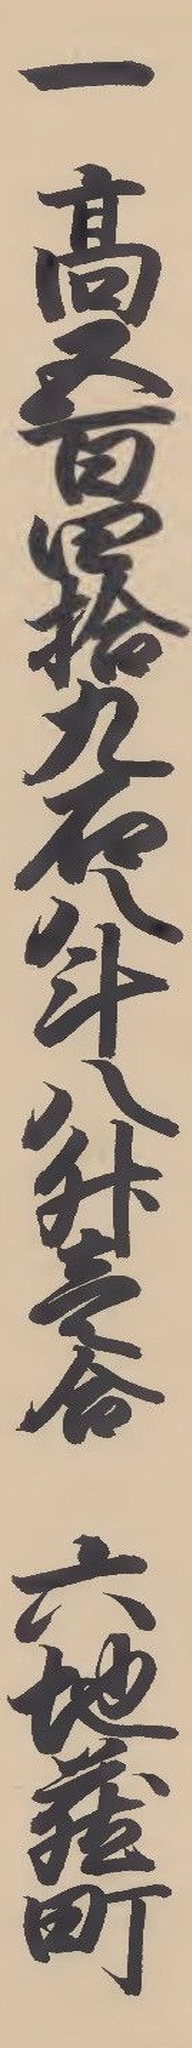一高五百四拾九石八斗八升壱合六地蔵町
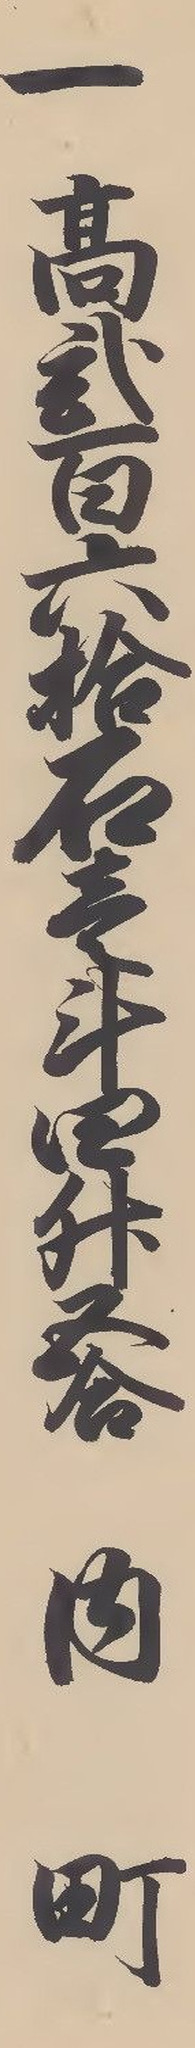一高弐百六拾石壱斗四升五合内町
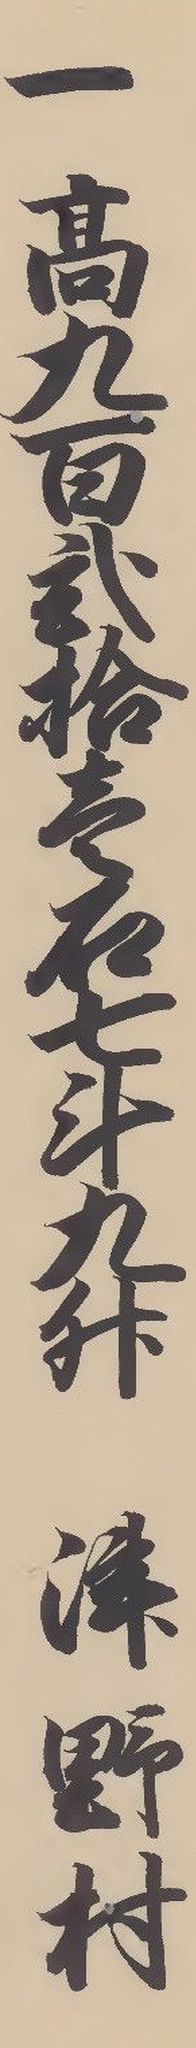一高九百弐拾壱石七斗九升津野村
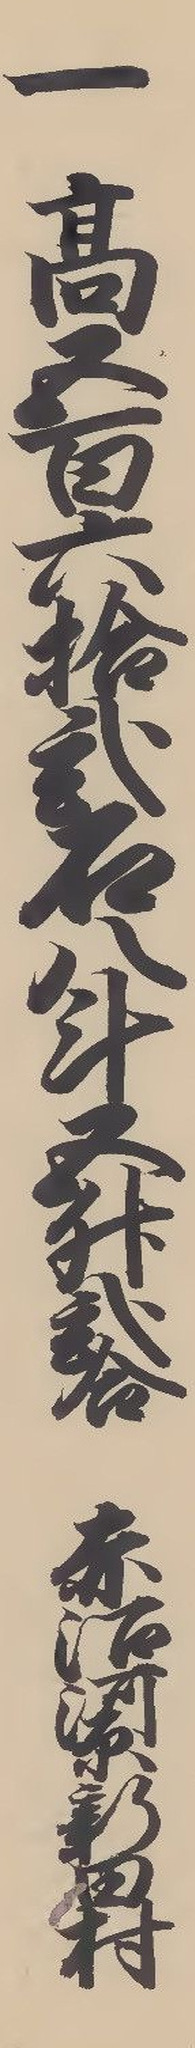一高五百六拾弐石八斗五升弐合赤沼河原新田村
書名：信濃国郷帳
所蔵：国立公文書館 National Archives of Japan
